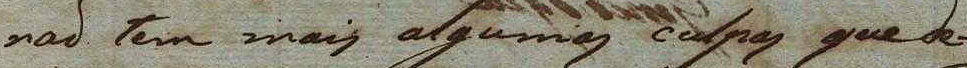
naõ tem mais algumas culpas que de
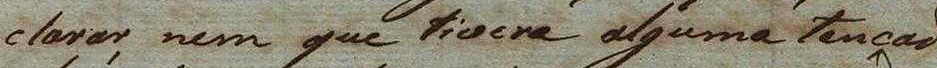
clarar, nem que tivera alguma tençaõ
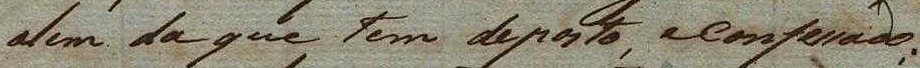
alem da que tem deposto, e confessado;
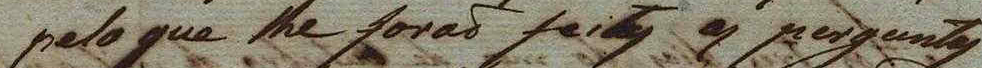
pelo que lhe foraõ feitas as perguntas
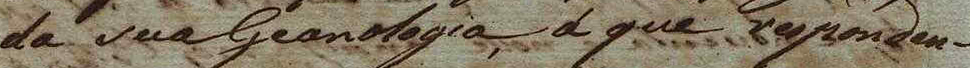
da sua Geanologia, á que responden
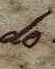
do.
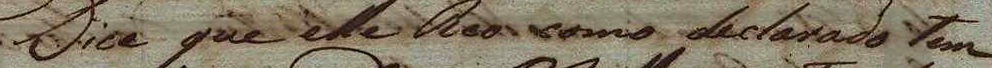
Dice que elle Reo como declarado tem
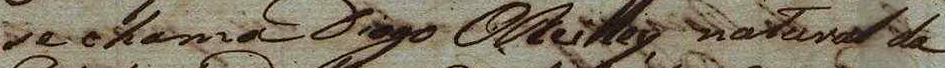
se chama Diogo OReilley, natural da
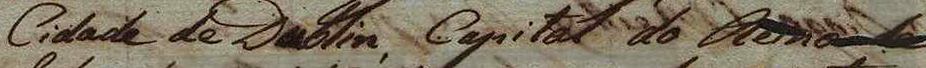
Cidade de Dublin, Capital do Reino de
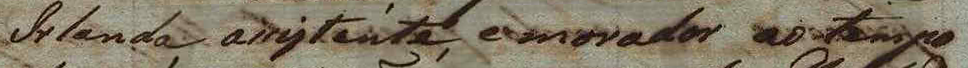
Irlanda, assistente, e morador ao tempo
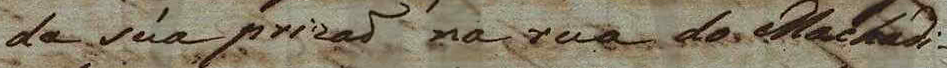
da sua prizaõ na rua do Machadi
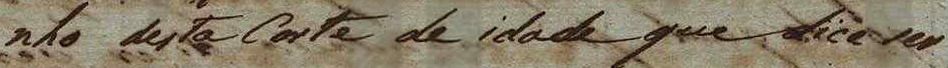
nho desta Corte de idade que dice ser
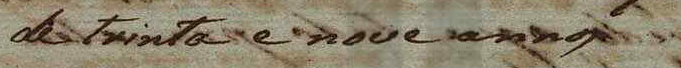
de trinta e nove annos
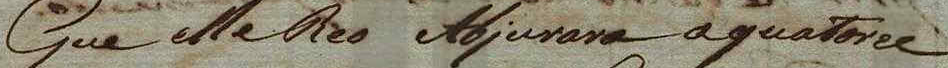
Que elle Reo Abjurara a quatroze
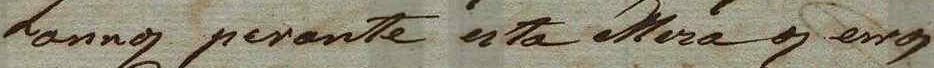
annos perante esta Meza os erros
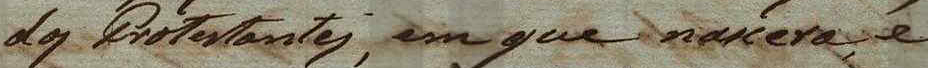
dos Protestantes, em que nascera, e
